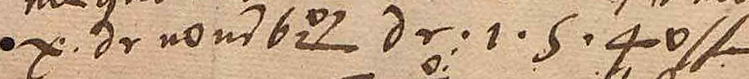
x. de nouēbro de .1.5.40 //
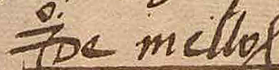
Jo de mello
